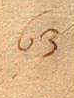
63
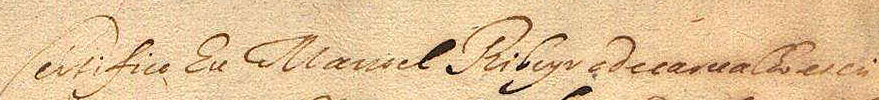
Certifico Eu Manoel Ribeyro de carualho escri
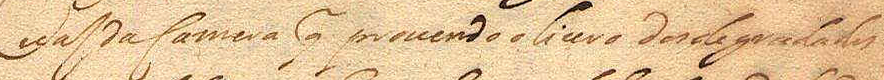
uaꝭ da Camera q̄ prouendo o liuro dos degradados
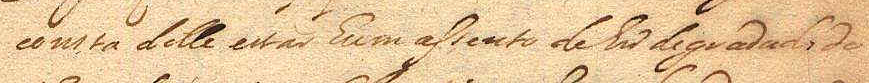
consta delle estar hum assento de hū degradado de
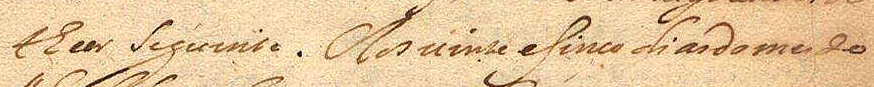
theor seguinte. Aos uinte e sinco dias do mes de
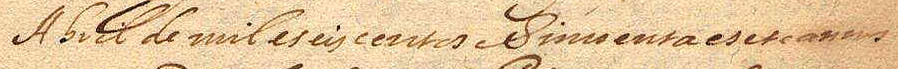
Abril de mil e seiscentos e Sincoenta e sete annos
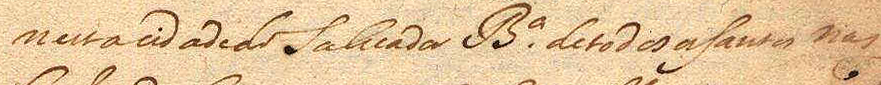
nesta cidade do Saluador B.a de todos os santos nas
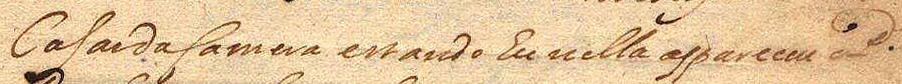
Casas da Camera estando Eu nella apareceu o L.do
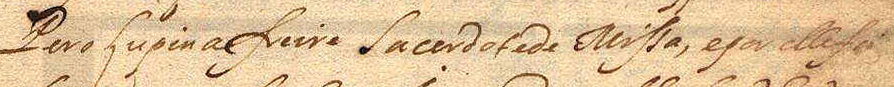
Pero Lupina freire Sacerdote de Missa, e por elle foi
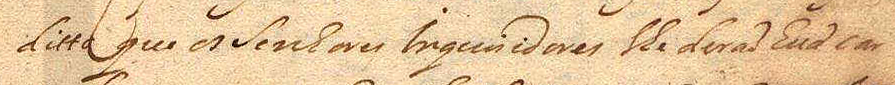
ditto que os Senhores Inquisidores lhe deraõ huā car
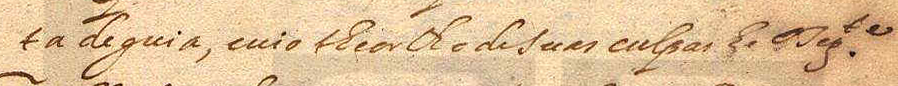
ta de guia, cuio theor &c de suas culpas he o seg.te
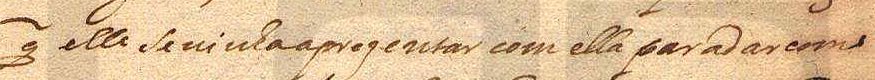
q̄ elle se uinha aprezentar com ella para dar com
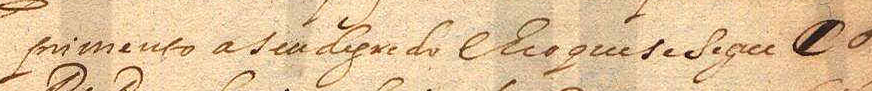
primento a seu degredo e he o que se segue ⁋ o
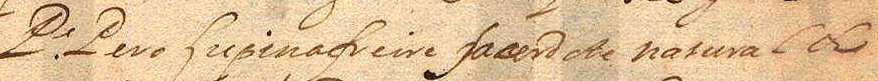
P.e Pero Lupina freire sacerdote natural &
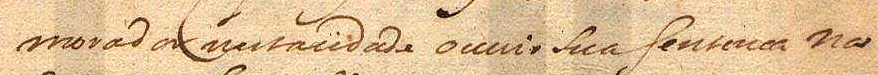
morador nesta cidade ouuio sua sentença na
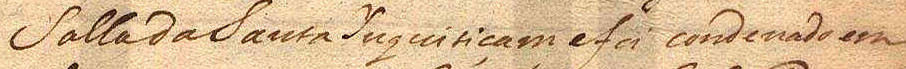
Salla da Santa Ynquisiçam e foi condenado em
